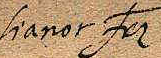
lianor f̄rz
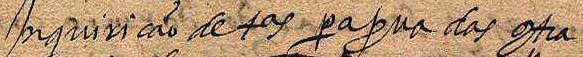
Jnquiricão de tas ꝑ ꝓua das ꝯtra
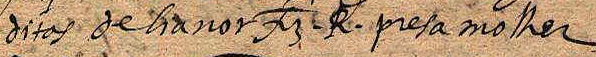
ditas de lianor f̄rz .R. presa molher
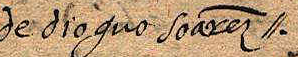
de dioguo soar̄ez //.
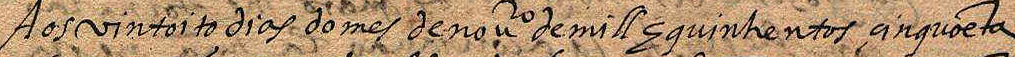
Aos vintoito dias do mes de nouro de mill E quinhentos çinquoēta
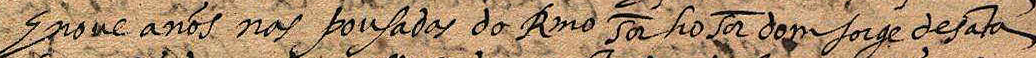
E noue anōs nas pousadas do Rmo s̄or ho s̄or dom Jorge de sāta
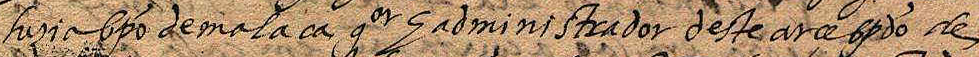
luzia bpō de malaca gor E administrador deste arçebpdō de
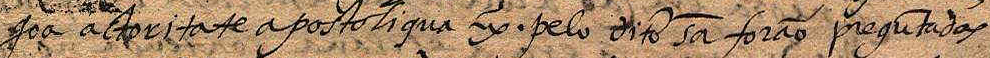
goa actoritate apostoliqua c̄ꝭ. pelo ditō s̄or forão pregūtadas
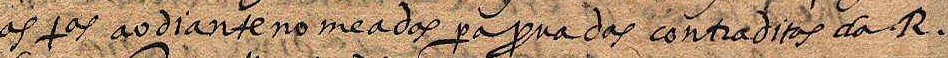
as tas ao diante nomeadas ꝑa ꝓua das contraditas da .R.
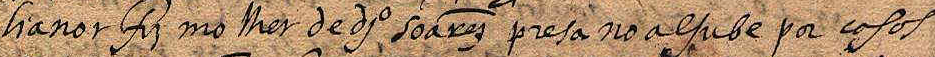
lianor f̄rz molher de djo soar̄ez presa no alJube por casos
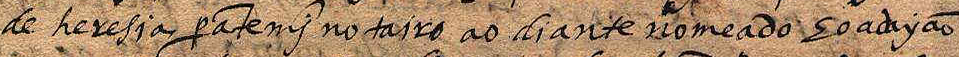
de heresia ꝑāte mj̄ notairo ao diante nomeado E o adayão
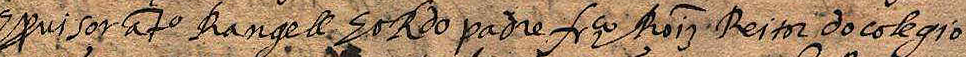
E ꝓuisor āto Rangell E o Rdo padre frço Roīz Reitor do colegio
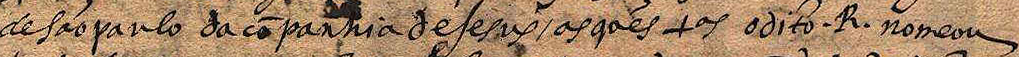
de São paulo da cōpanhia de Jesus / as qaēs tas o ditō .R. nomeou
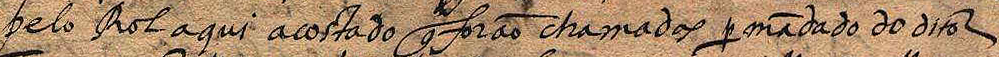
pelo Rol aqui acostado q̄ forão chamadas ꝑ mādado do ditō
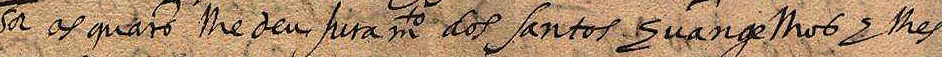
S̄or as quaēs lhe deu Juramto dos Santos Euangelhos E lhes
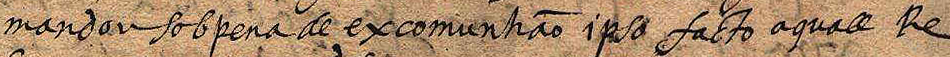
mandou sob pena de excomunhão ipso facto a quall Re
